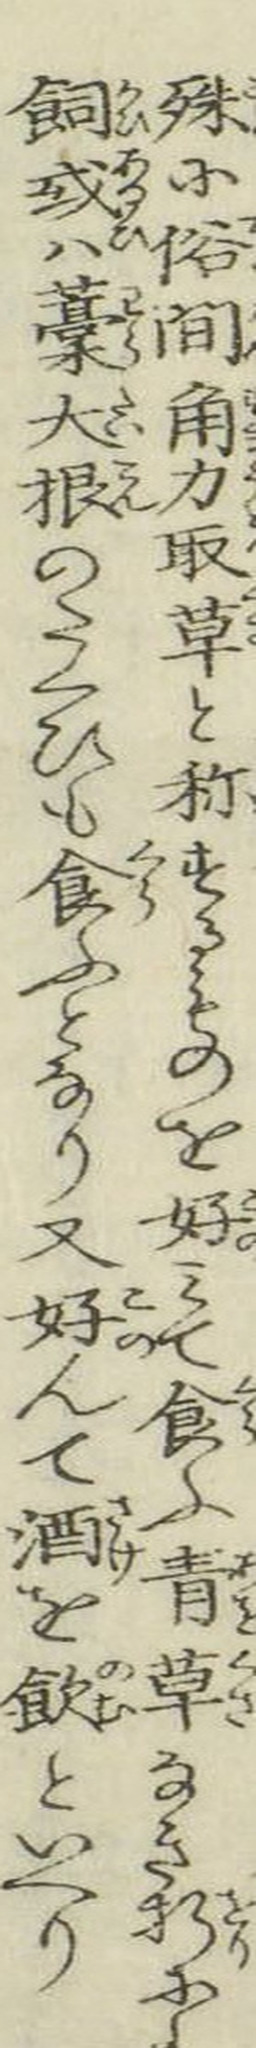飼或は藁大根のたくひも食ふとなり又好んて酒を飲といへり
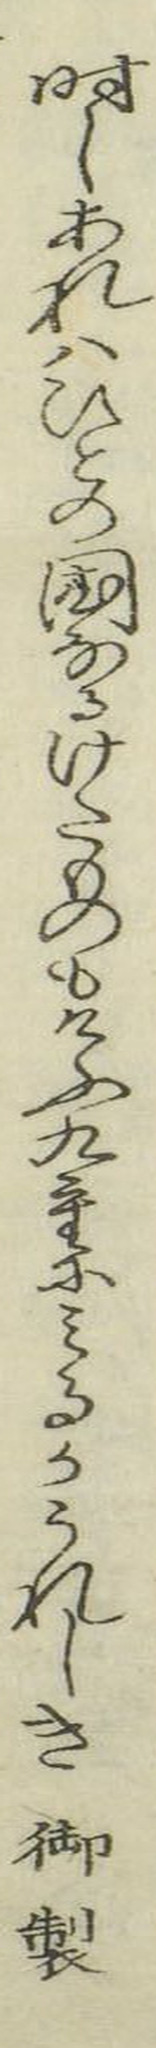時しあれはひとの国なるけたものもけふ九重にみるかうれしき御製
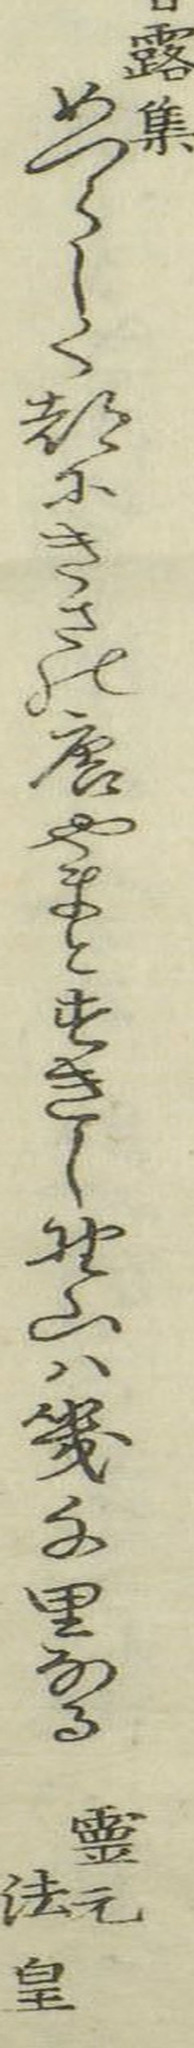めつらしく都にきさの唐やまとすきし野山は幾千里なる霊元法皇

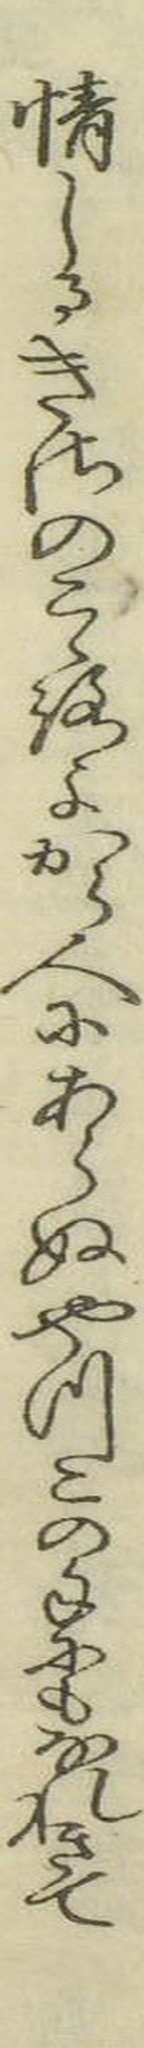情しるきさのこゝろよから人にあらぬやつこの手にもなれきて同
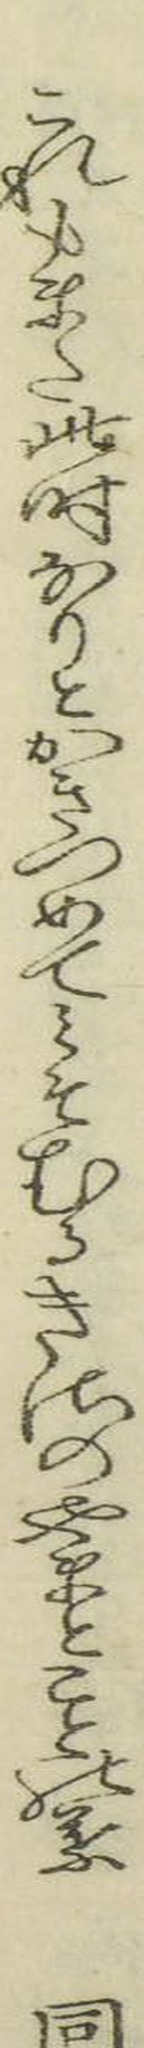これもまた此時なりとかきつめてみそむるきさのやまとことの葉同
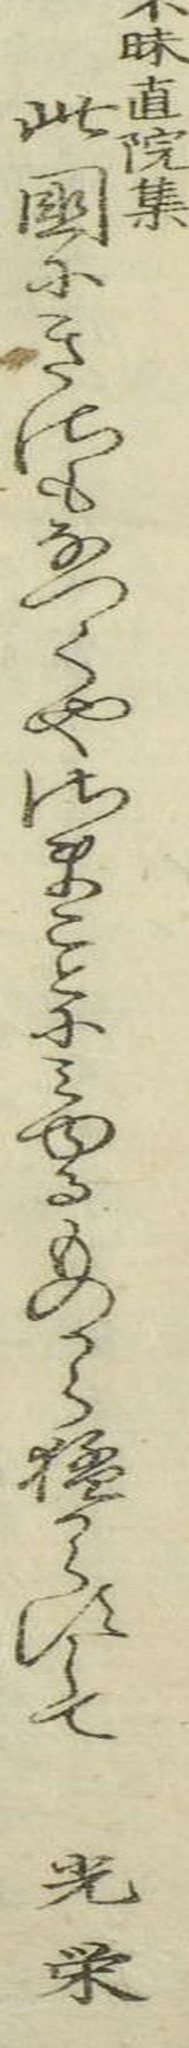此国にきさもなつくやさまことにみゆるものから猛からすして光栄
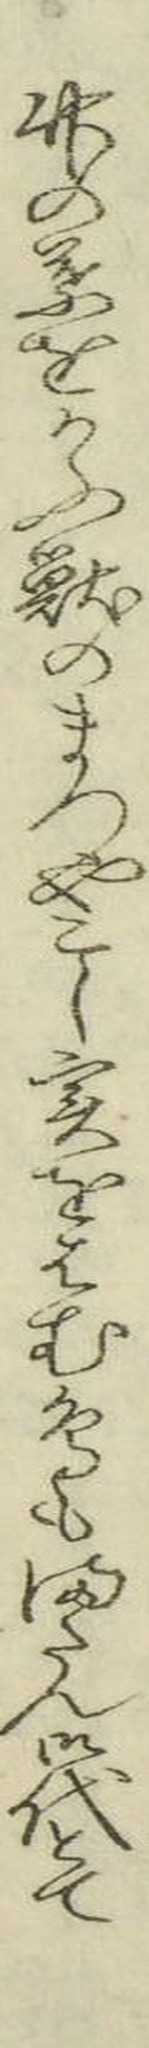竹の葉をかふ獣のまつやこし実をはむ鳥もまたん御代とて同
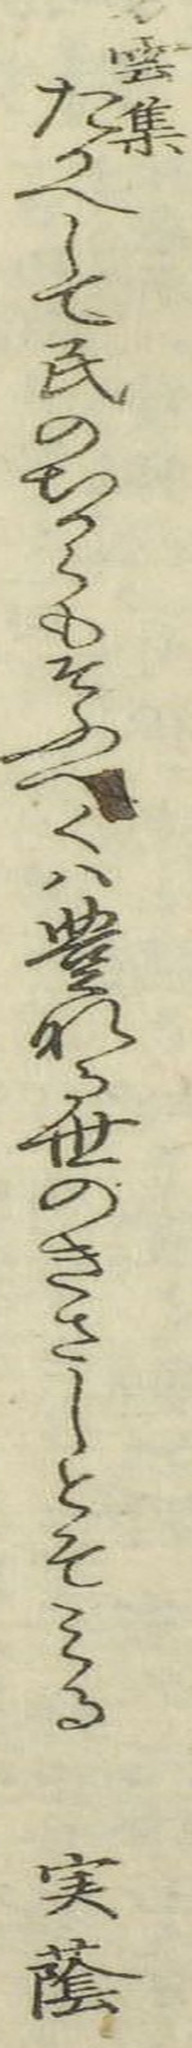たかへして民のちからもそふへくは豊なる世のきさしとそみる実蔭
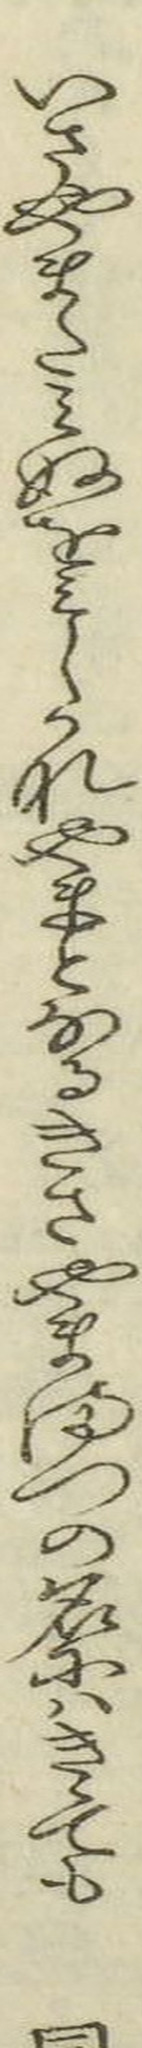いさやまたみぬをみしかなやまとなるきさやままつの名にはきゝても同
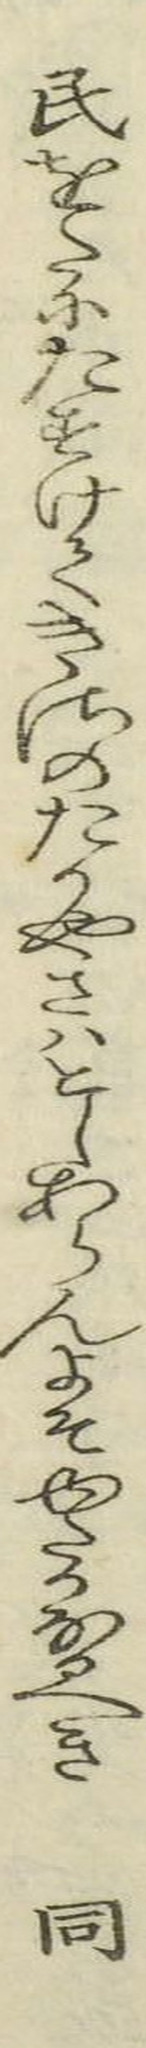民をたにたすけてきさのたかやさはとしあらんよそゆたかなるへき同
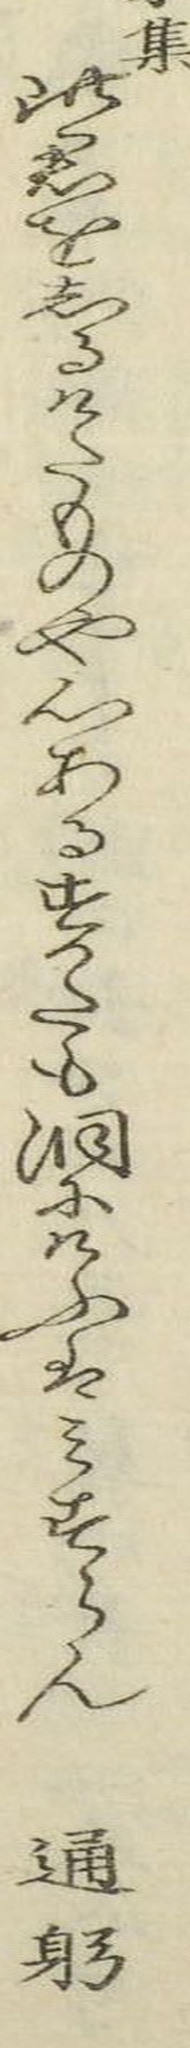此君をしるけたものや心あるすかたも洞にけふはみすらん通躬
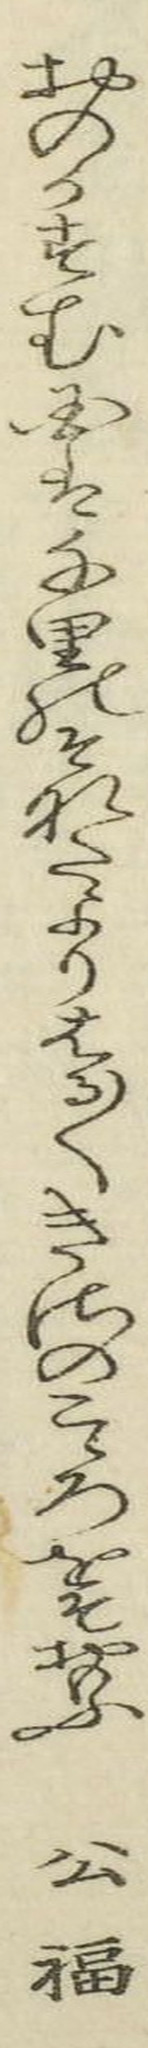おのかすむ国は千里のそなたよりはる〳〵きさのこゝろをそおもふ公輻
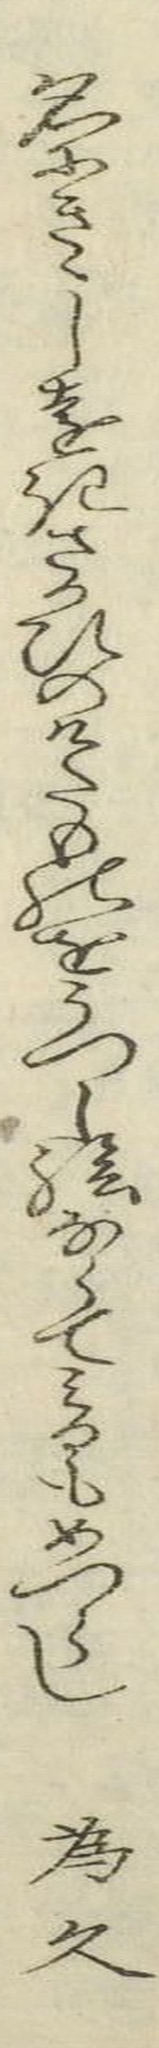名にきゝし遠きさかひのけたものをうつし絵ならてみるもめつらし為久
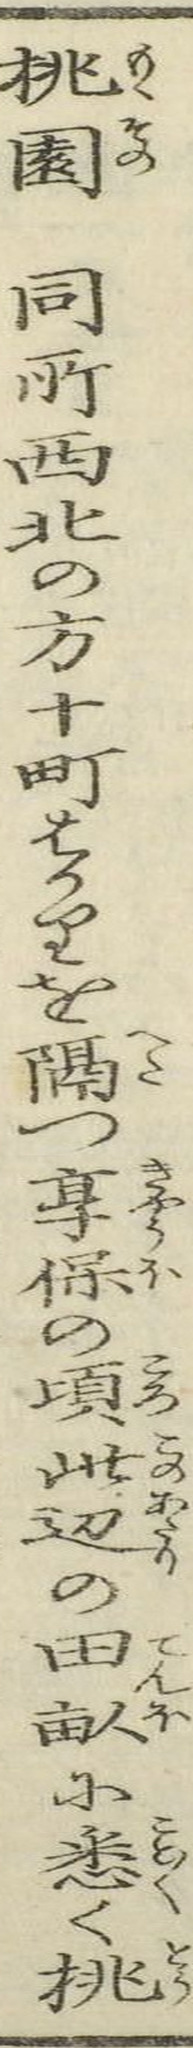桃園同所西北の方十町はかりを隔つ享保の頃此辺の田畝に悉く桃
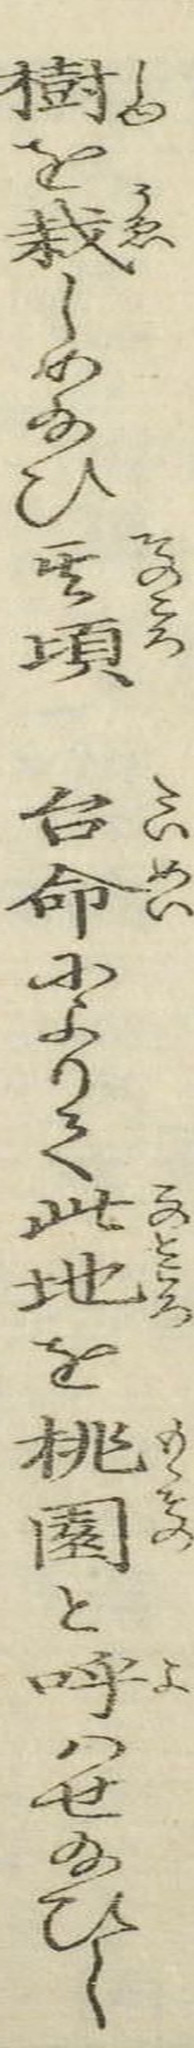樹を栽しめ給ひ其頃台命によりて此地を桃園と呼はせ給ひし
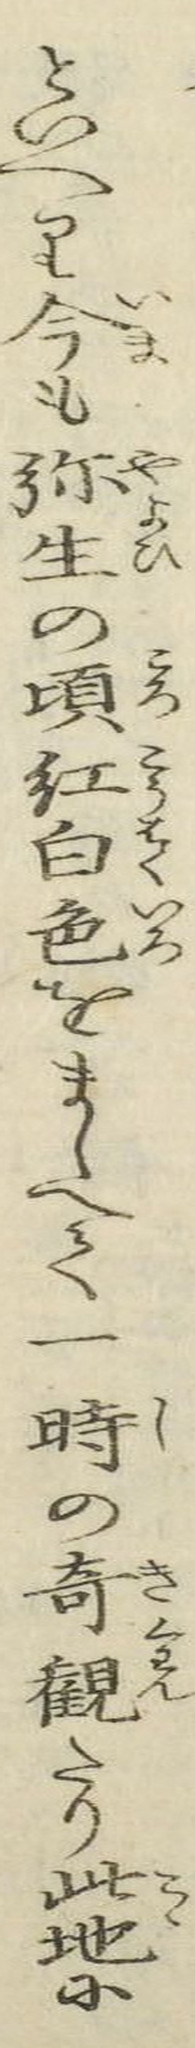といへり今も弥生の頃紅白色をましへて一時の奇観たり此地に
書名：江戸名所図会 20巻 巻之11
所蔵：東京学芸大学教育コンテンツアーカイブ
